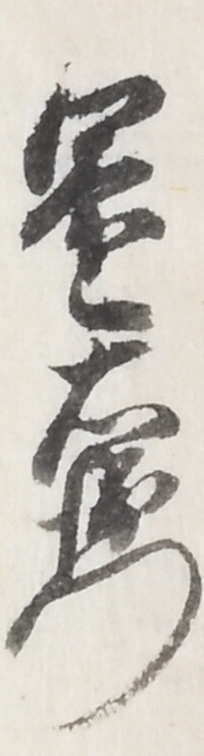柴右衛門
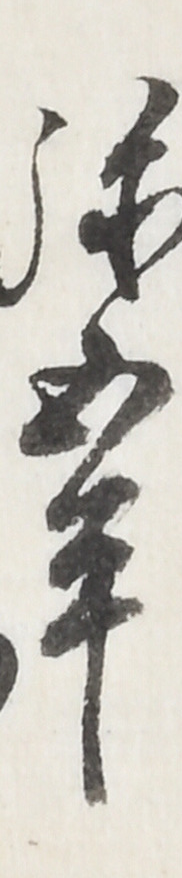弥五平
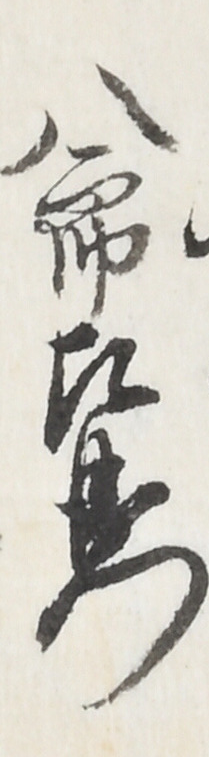八郎左衛門
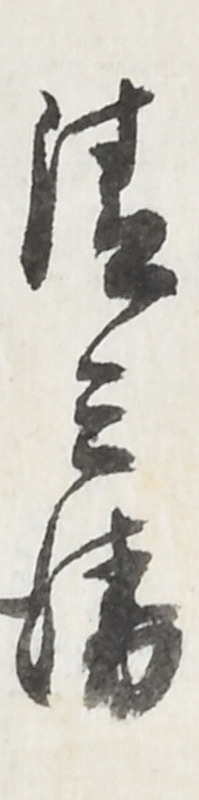清兵衛
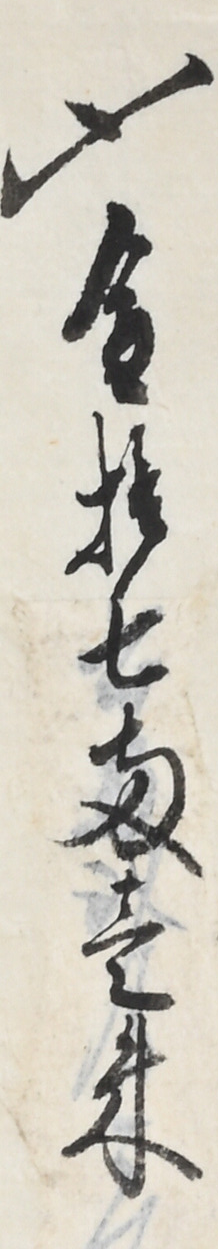〆金拾七両壱朱

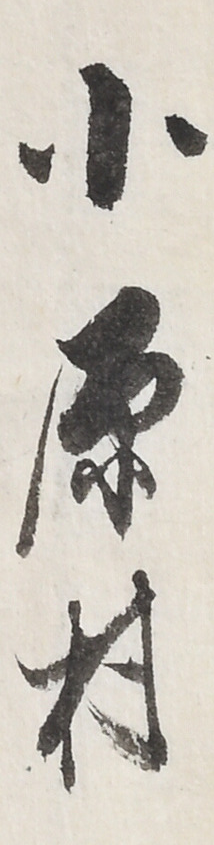小原村
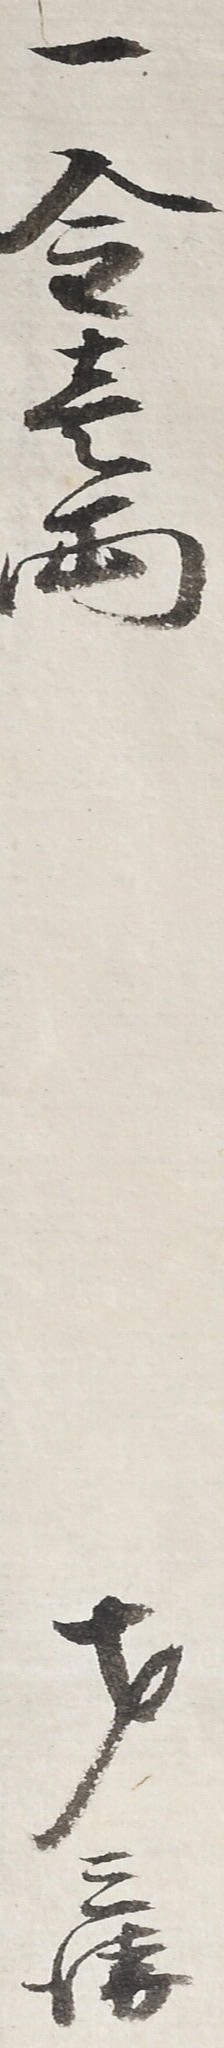一金壱両才兵衛
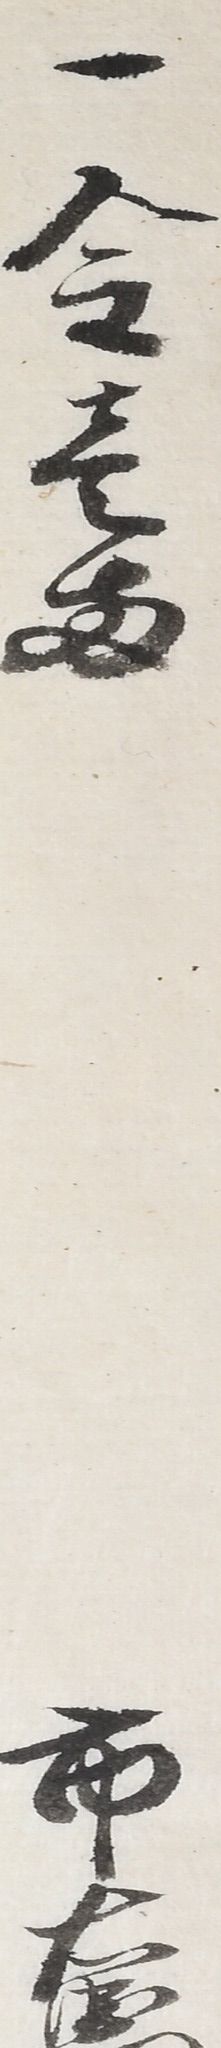一金壱両市右衛門
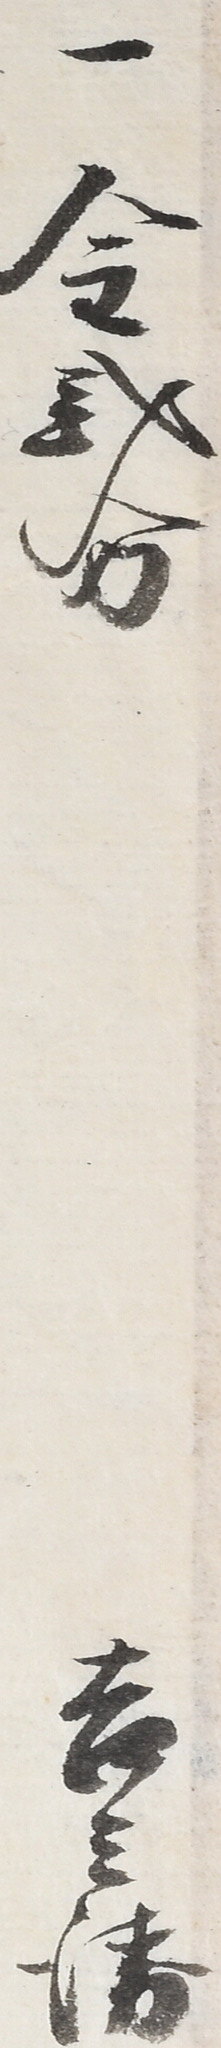一金弐分吉兵衛
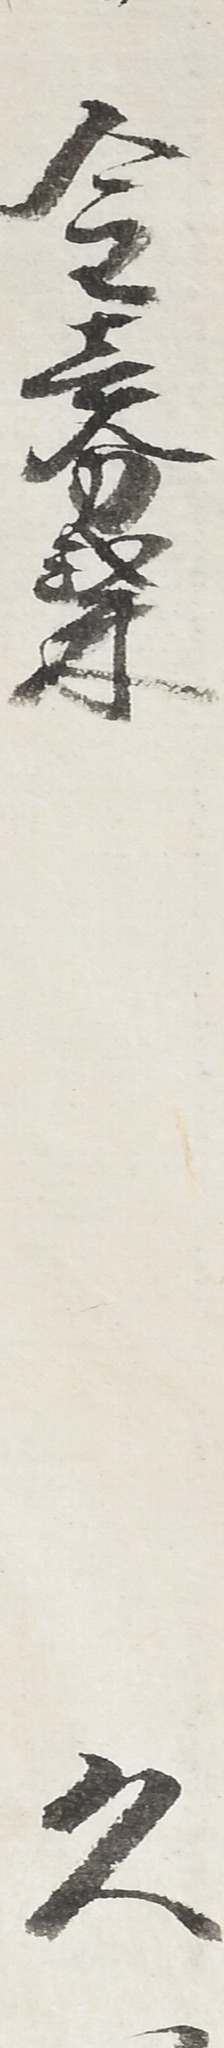一金壱分弐朱久弥
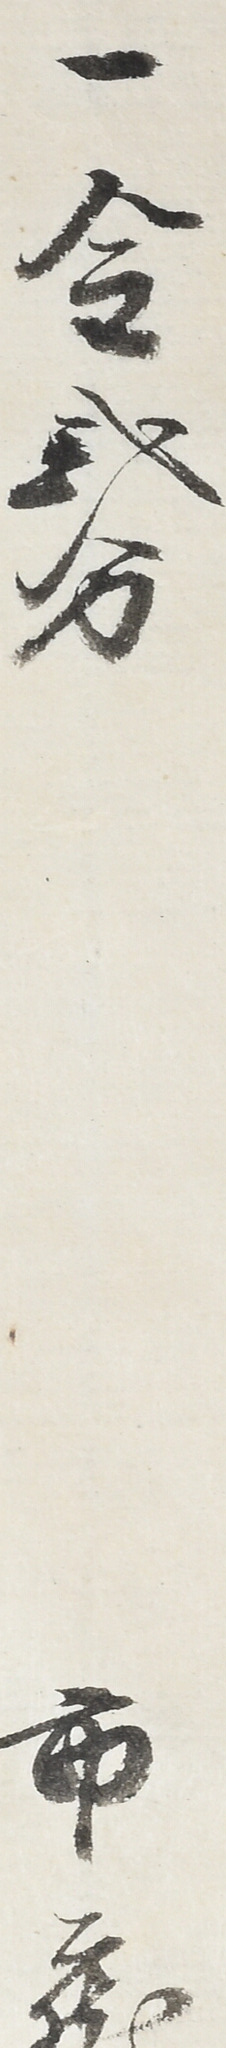一金弐分市蔵

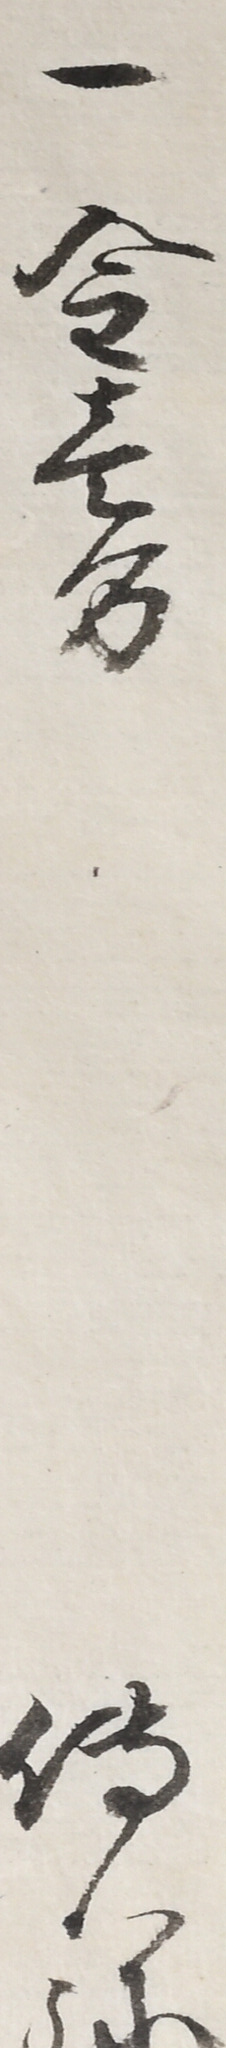一金壱分伝弥
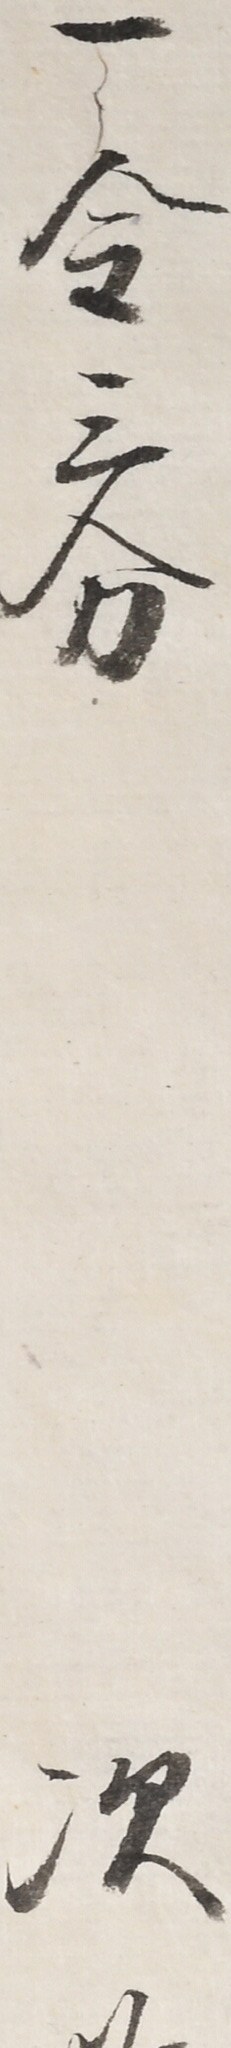一金三分次作
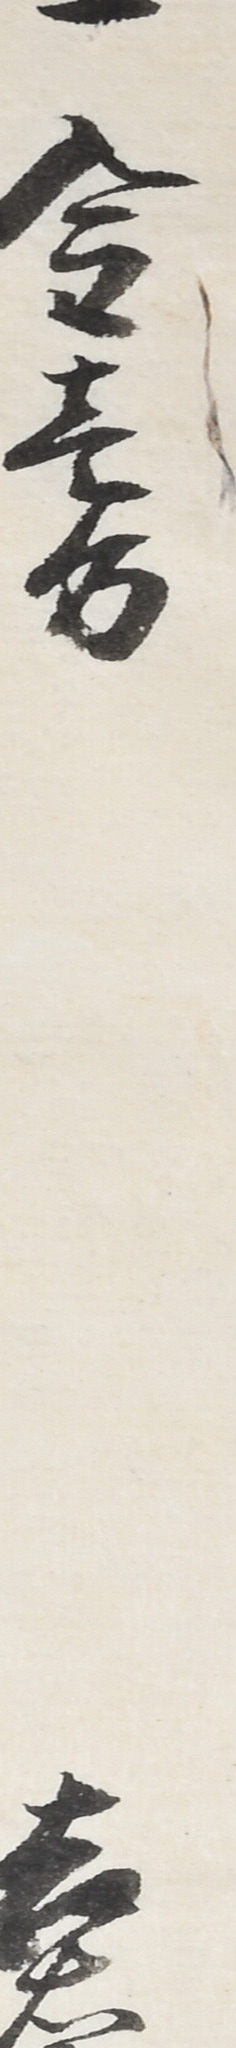一金壱分吉右衛門
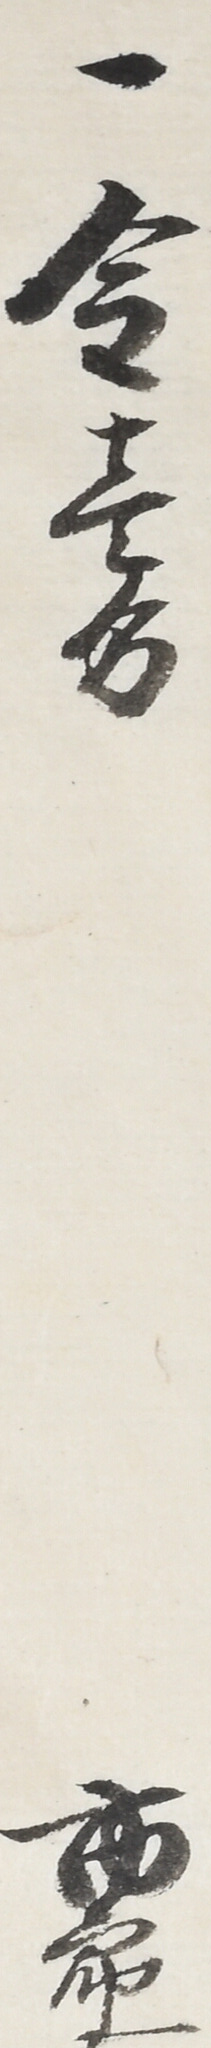一金壱分菊五郎
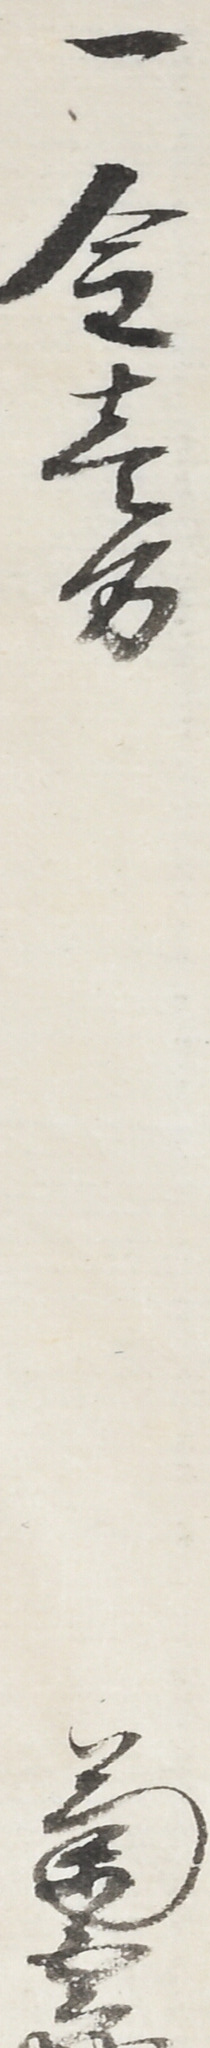一金壱分菊五郎
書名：御拝地百五拾年御祝儀献上御目録名前
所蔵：伊那市立高遠町図書館・合同会社AMANE
